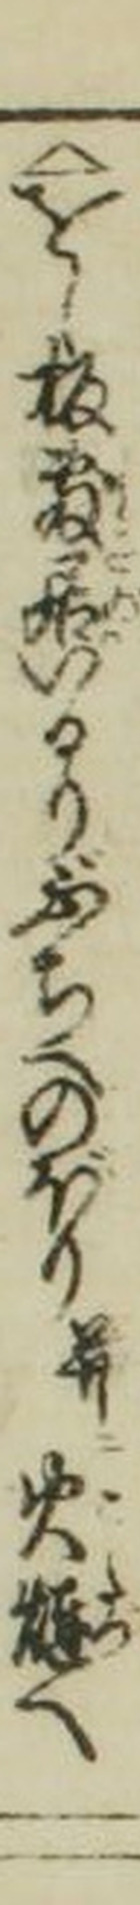△をし板敷居。いるりぶちへのぼり并に火燵へ
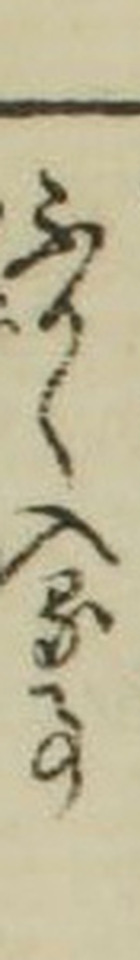ふかく入る事
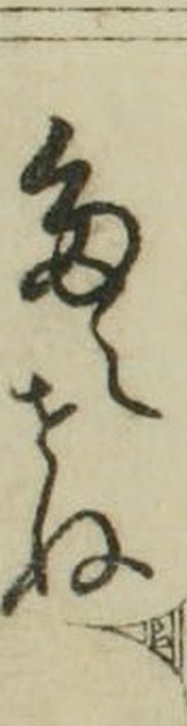たえせぬ
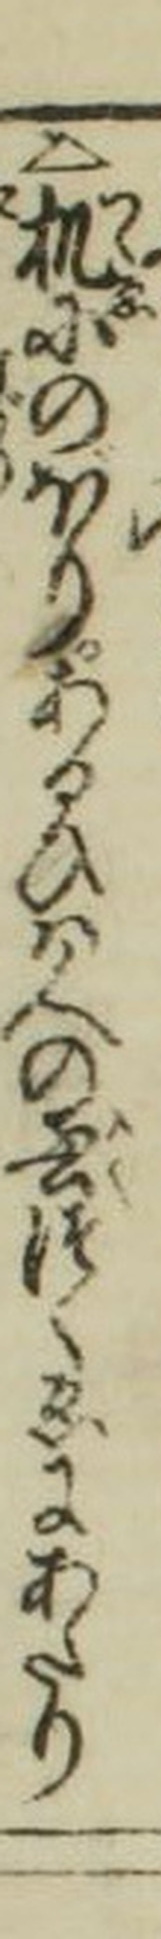△机にのぼり。あるひは人の書つくゑにあたり
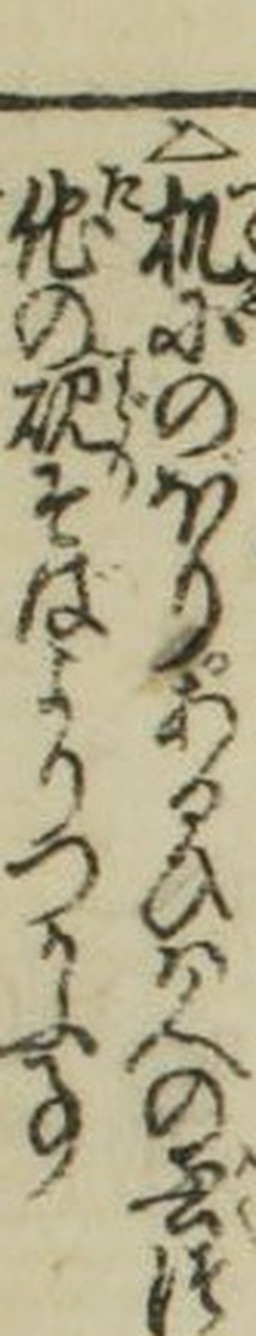他の硯そばよりつかふ事
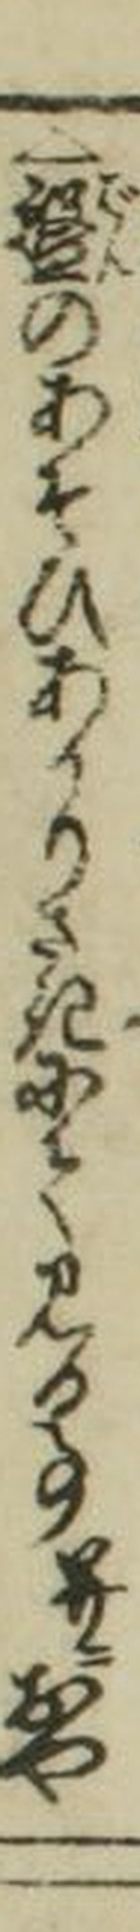△盤のあそひあかりさきにて見る事并におや
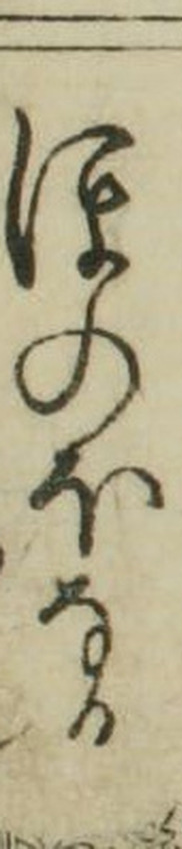ほのほなる
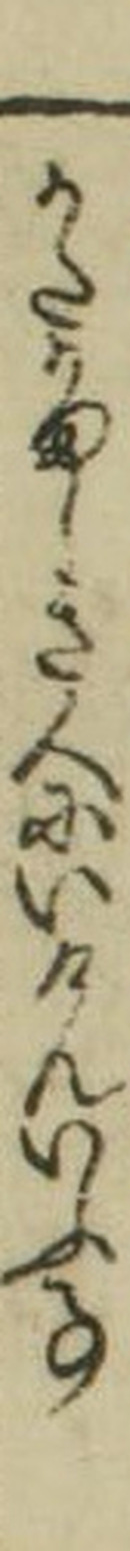かたかましき人にいけんいふ事

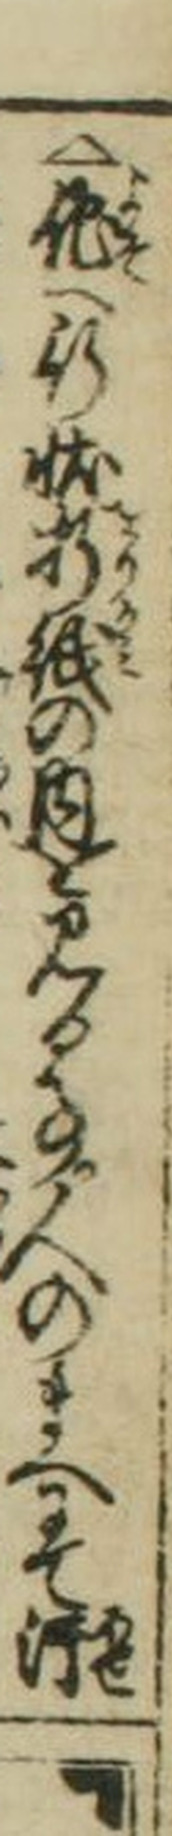△他へ行状折紙の内を見る事。人のまへにて汗
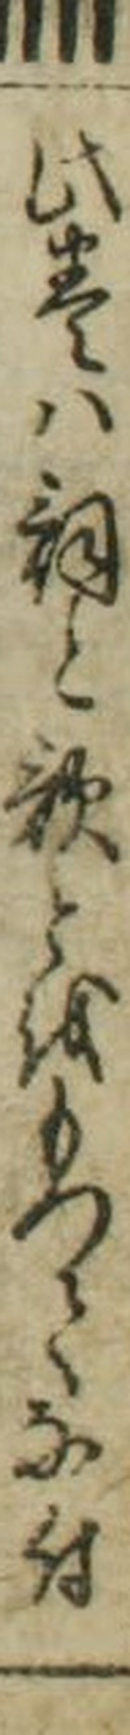此巻は詞と歌とをもつてな付
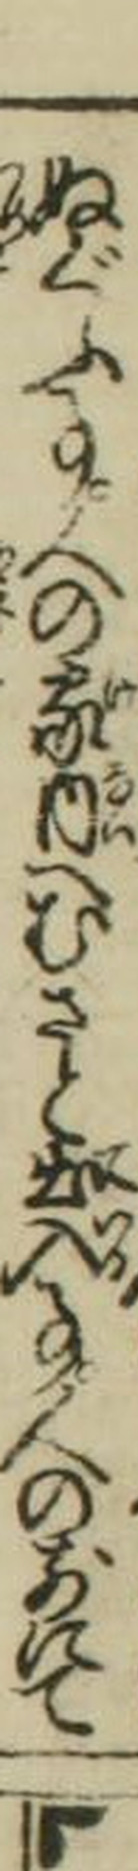ぬぐふ事。人の家内へむさと出入事。人の前にて
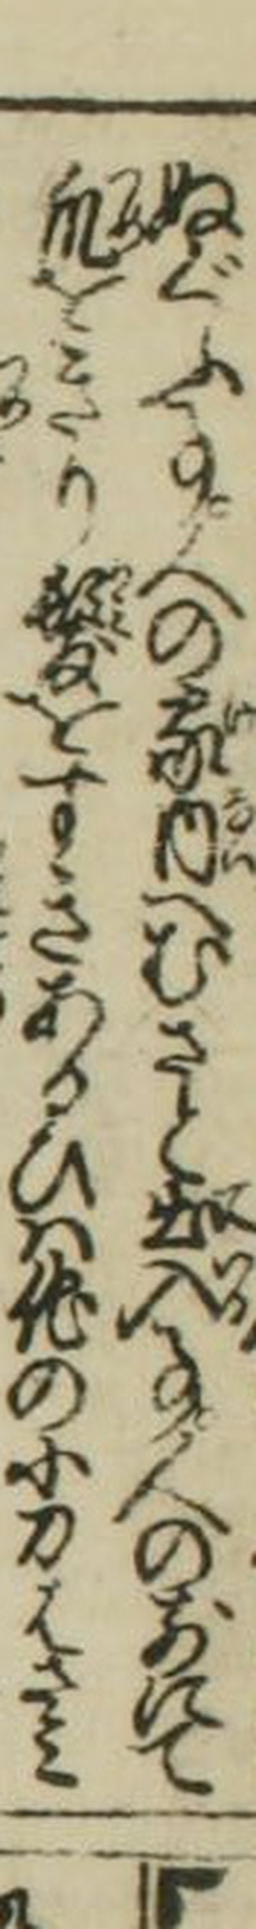爪をきり髪をすきあるひは他の小刀はさみ
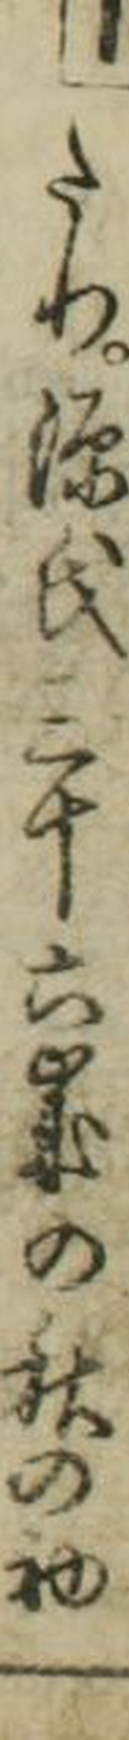たり。源氏三十六歳の秋の初
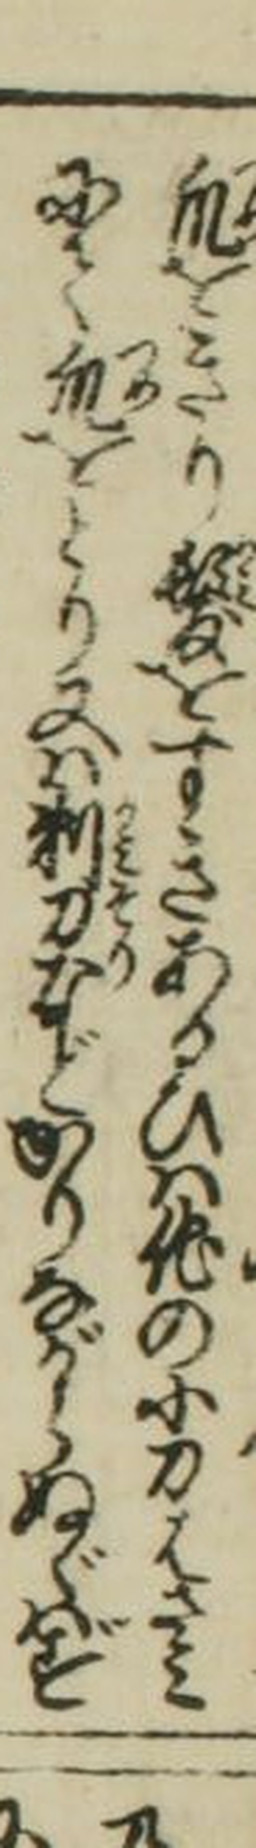にて爪をとり又は剃刀などかりながらぬぐはず
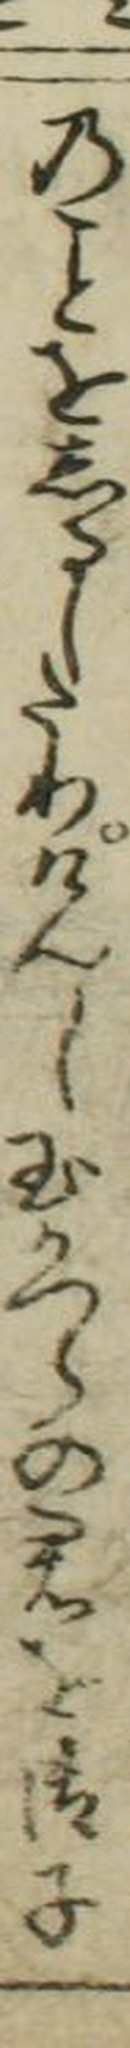のことをしるしたり。けんし玉かつらの君を御子
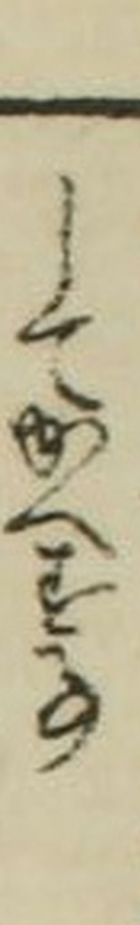してかへす事
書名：女源氏教訓鑑
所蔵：東京学芸大学附属図書館
